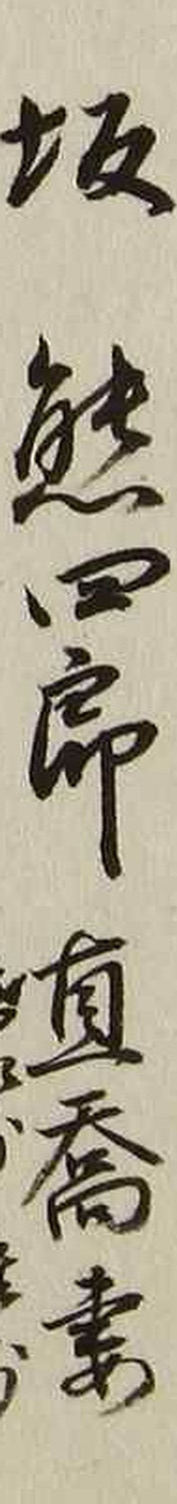女坂熊四郎直喬妻
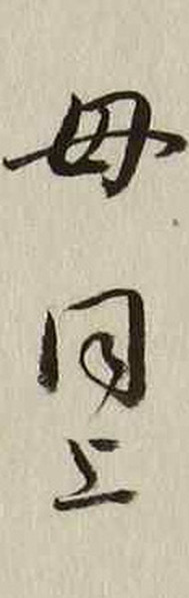母同上
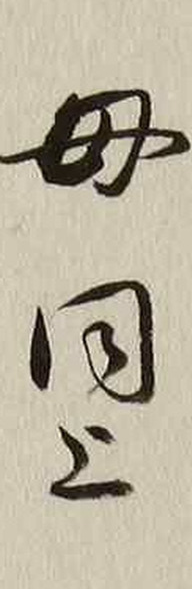母同上
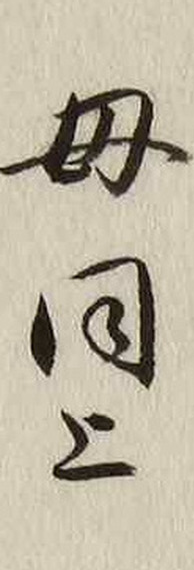母同上
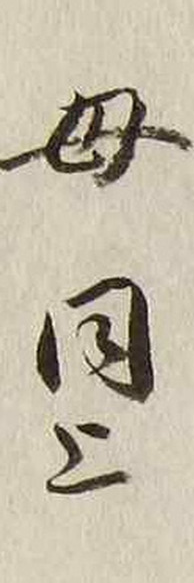母同上

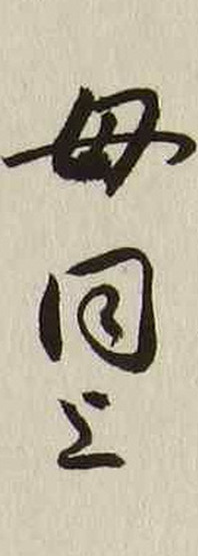母同上
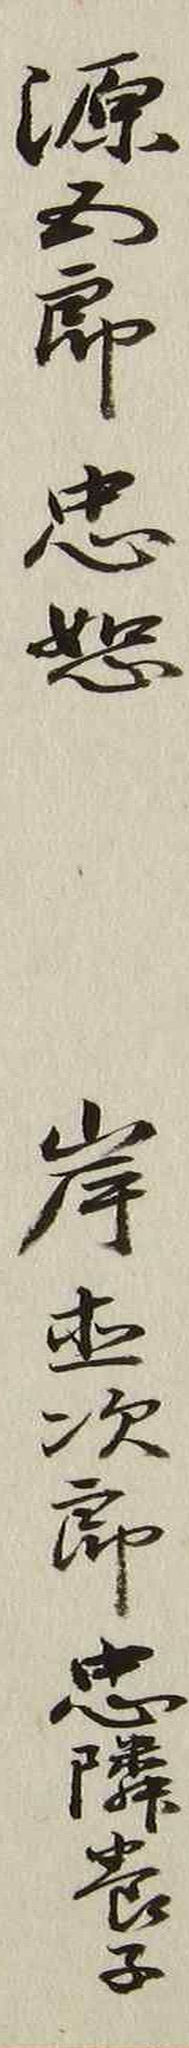源五郎忠恕岸直次郎忠隣養子
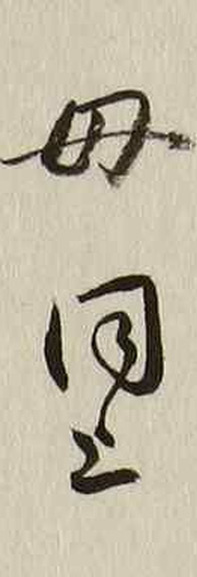母同上
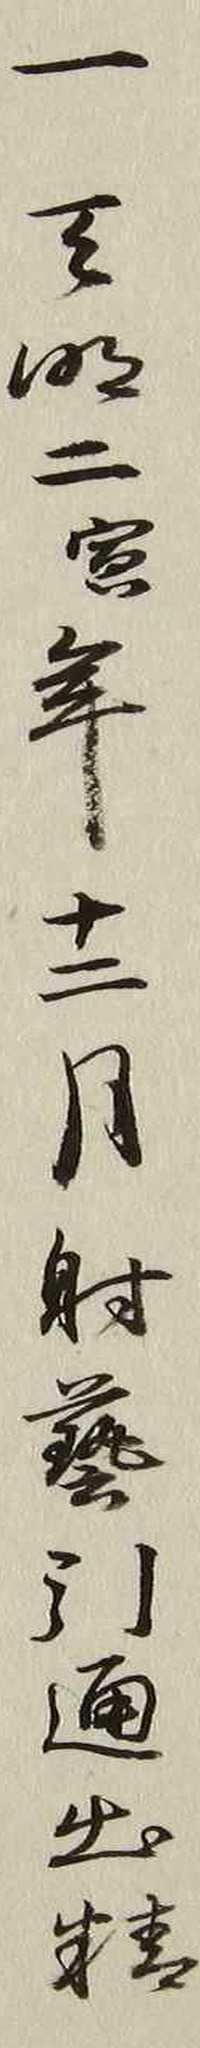一天明二寅年十二月射芸引通出精
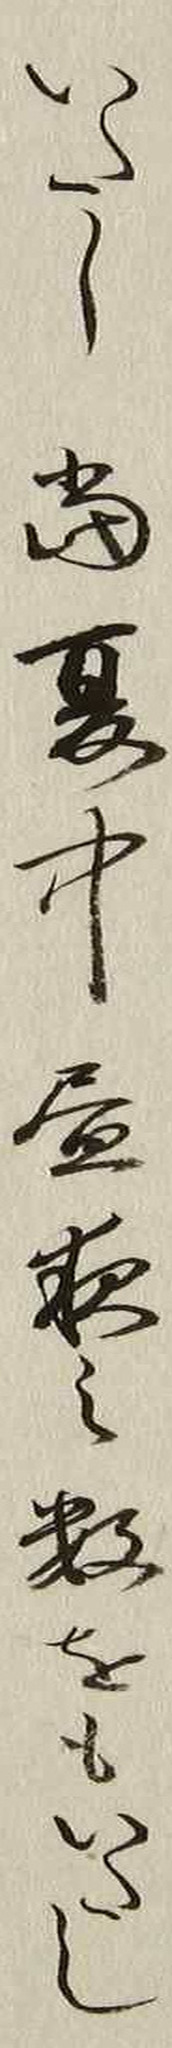いたし当夏中昼夜之数をもいたし
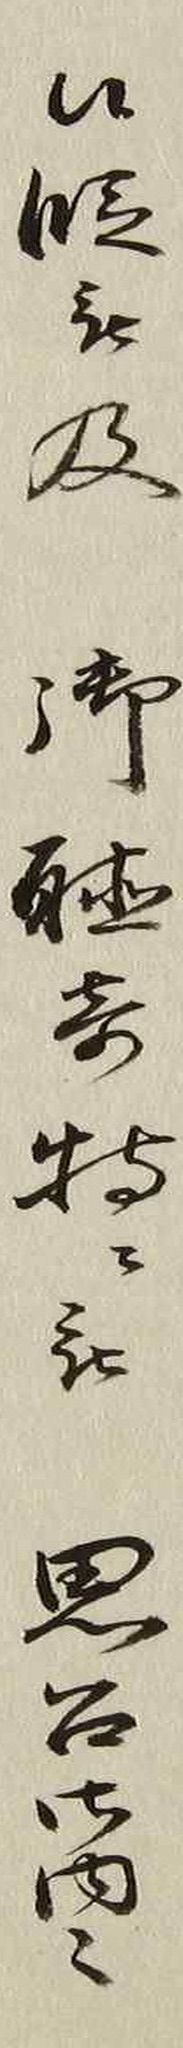候段被及御聴奇特ニ被思召御内々
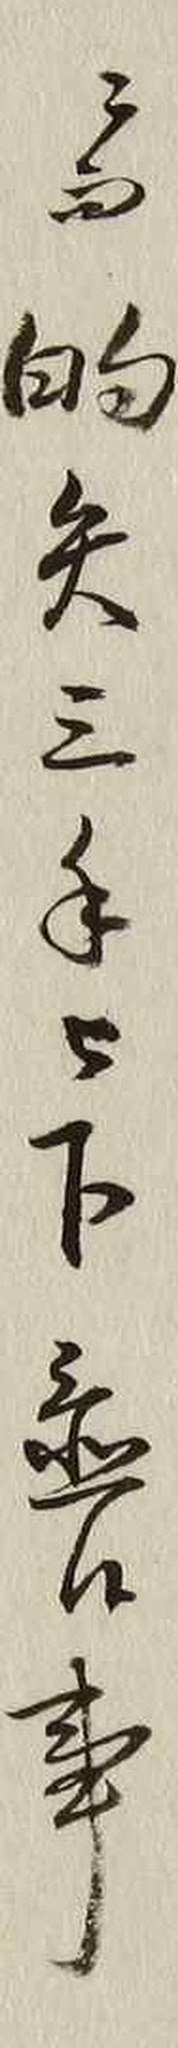ニ而的矢三手被下置候事
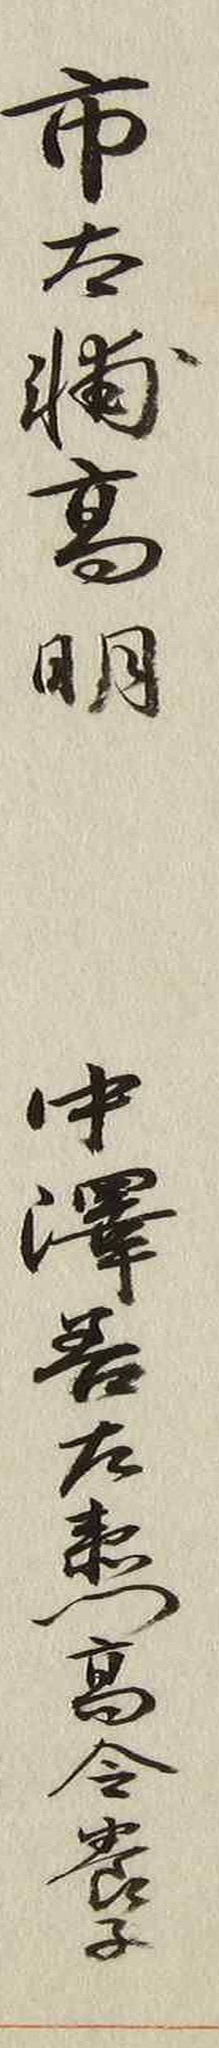市太輔高明中沢善左衛門高令養子
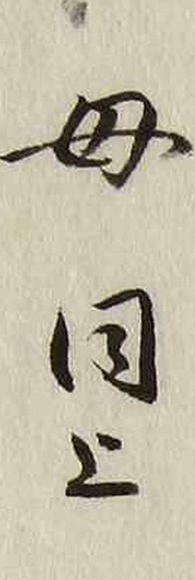母同上
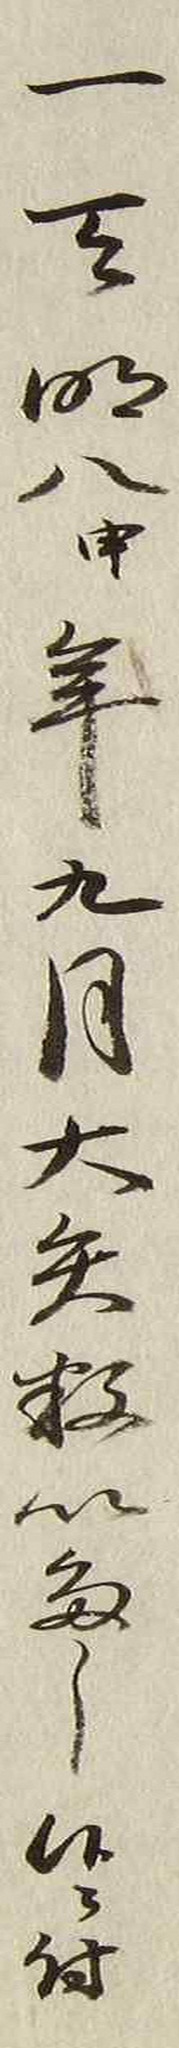一天明八申年九月大矢数いたし候ニ付
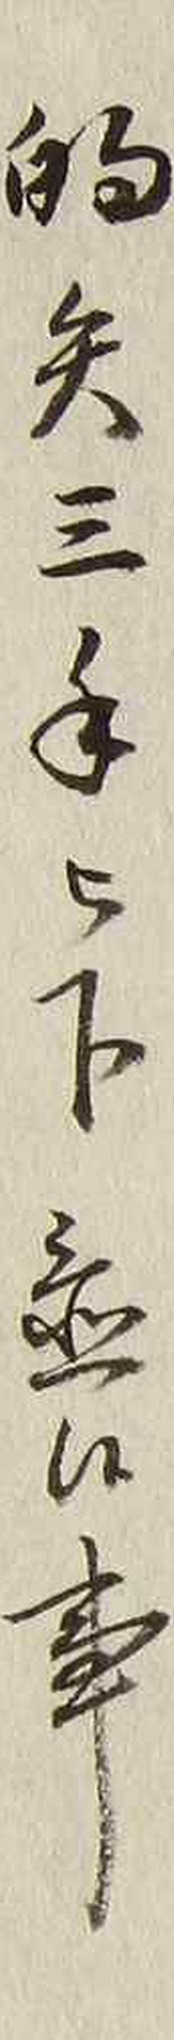的矢三手被下置候事
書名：諸士系譜　巻之160　な之部2
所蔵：会津若松市立会津図書館
